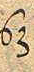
63
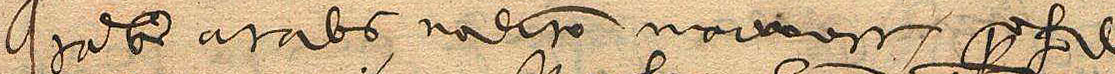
tābē atados no dito marmore / p̄o hōde
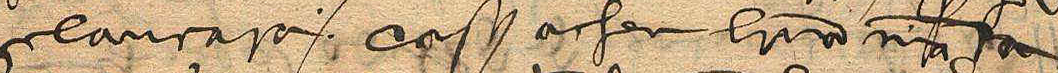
se lançara ./. e asy achou huā m̄ata
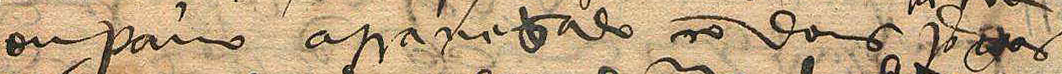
ou pano atrauesado cō dous p̄gos
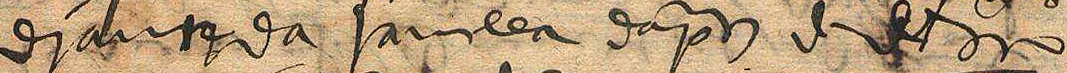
djante da Janella da p̄te de dētro
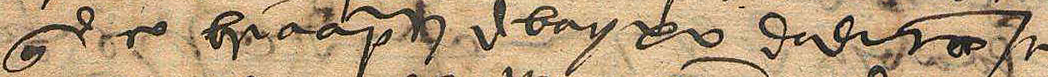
q̄ ēcobria a p̄te de bayxo da dita Ja
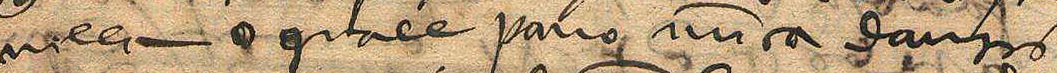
nella o quall pano nūca dantes
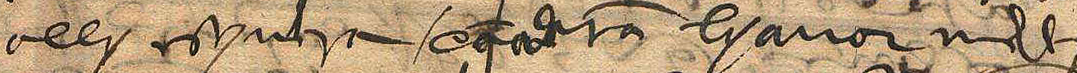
ally estjuera / e q̄ a dita lyanor mēdez
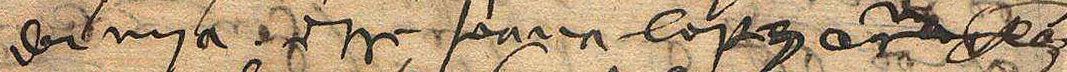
dormja ētre Joana lopez e cna gl̄lz
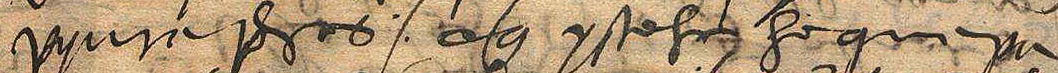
pynta p̄sas ./. e q̄ ysto he ho que pa
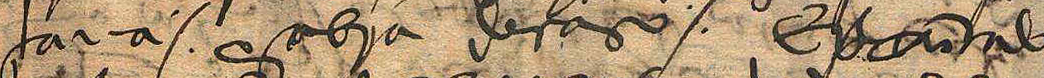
sara ./. e sabja do caso ./. E p̄gūtado
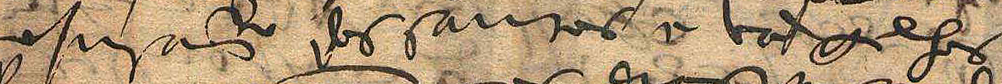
p̄o Juramto dos santos evāgelhos
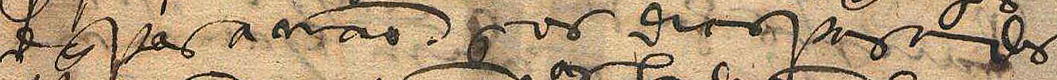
ē q̄ pos a mão se os dias pasados
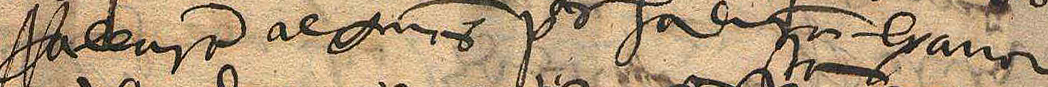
ffallarā algūas pas ha dita lyanor
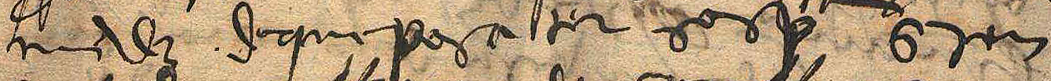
mēdez de que posa ter sospta serem
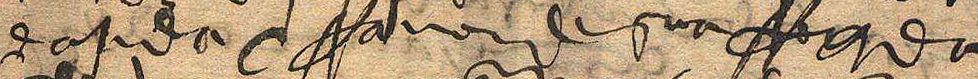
ē ajuda e ffauor de sua ffogjda
